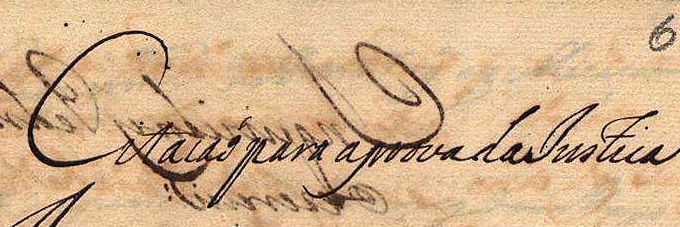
Citaçaõ para a prova da Iustiça
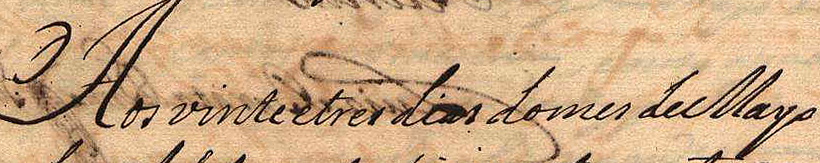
Aos vinte e tres dias do mes de Mayo
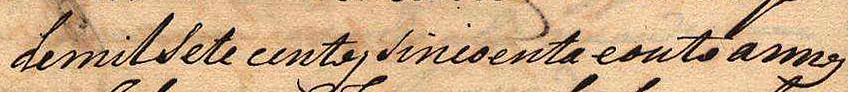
de mil setecentos sincoenta e outo annos
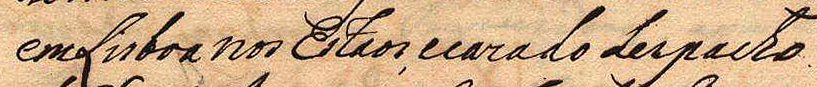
em Lisboa nos Estaos, e caza do despacho
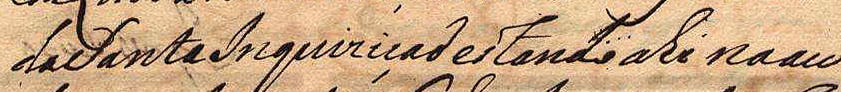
da Santa Inquiziçaõ estando ahi na au
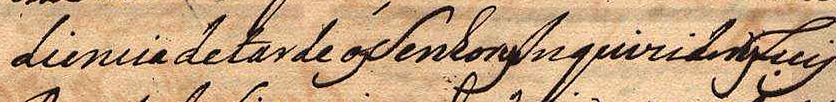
diencia de tarde o Senhor Inquizidores Luis
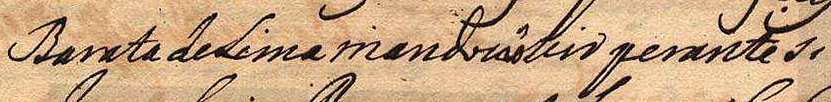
Barata de Lima mandoraõ vir perante si
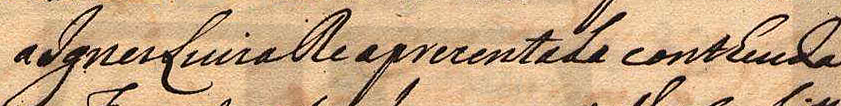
a Ignes Luiza Re aprezentada contheuda
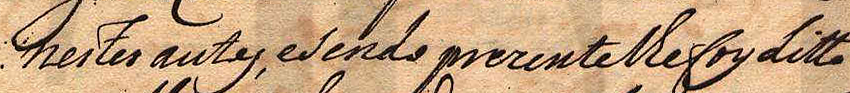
nestes autos, e sendo prezente lhe foy ditto
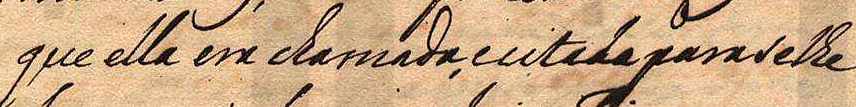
que ella era chamada, e citada para se lhe
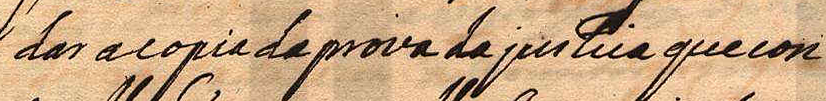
dar a copia da prova da justiça que con
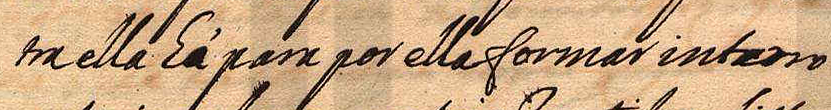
tra ella há para por ella formar interro
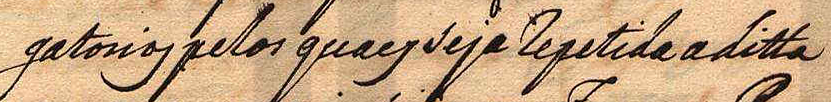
gatorios pelos quaes seja Repetida a ditta
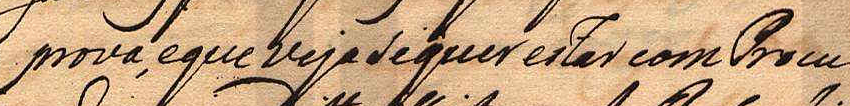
prova, e que veja se quer estar com Procu
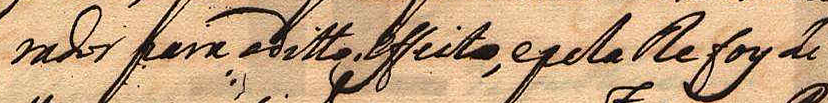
rador para o ditto effeito, e pela Re foy di
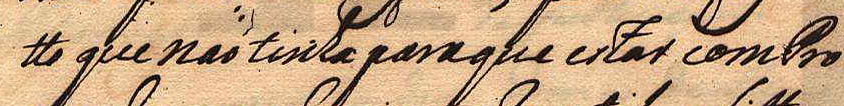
tto que naõ tinha para que estar com Pro
